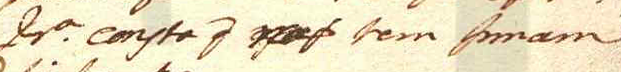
Pr.a consta q̄ naõ tem Jrmam
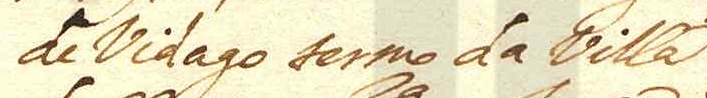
de Vidago termo da Villa
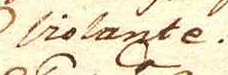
Violante.
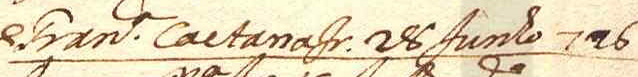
E Fran.ca Caetana Jr. 28 Junho 726
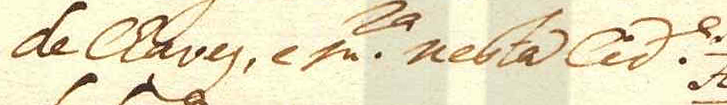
de Chaves, e m.ra nesta Cid̄.e
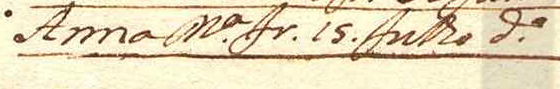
Anna M.a Jr. 15. Julho d.o
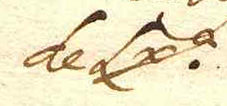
de Lx.a
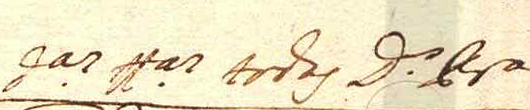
d.as tt.as todas D.os Pra
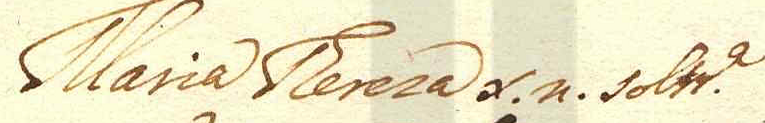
Maria Thereza x. n. soltr.a
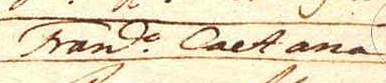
Fran.co Caetana
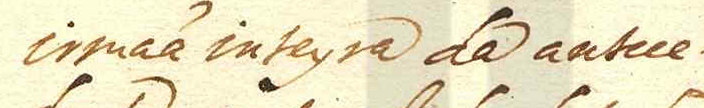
irmaā inteyra da antece
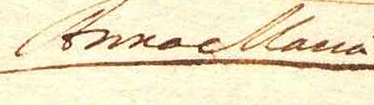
Anna Maria
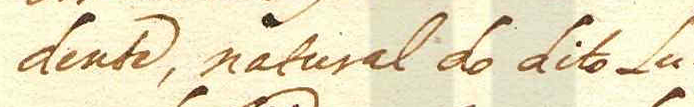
dente, natural do dito Lu
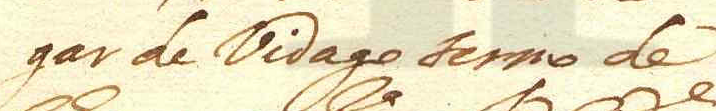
gar de Vidago termo de
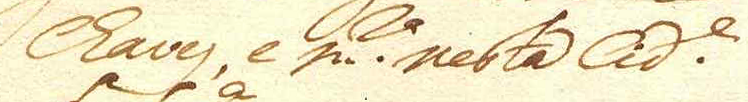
Chaves, e m.ra nesta Cid̄.e
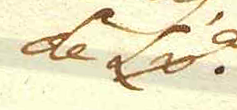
de Lx.a
